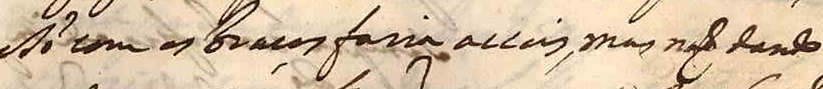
e só com os braços fazia acçois, mas naõ dando
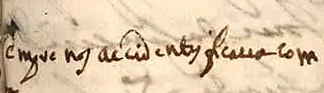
empre nos accidentes ficaua com
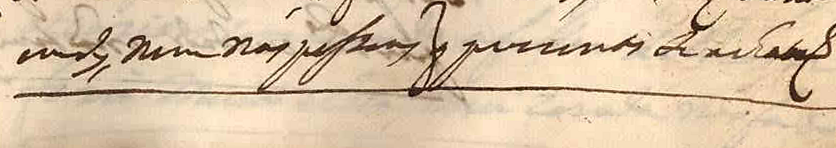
em sy, nem nas pessoas q̄ prezentes se achauaõ
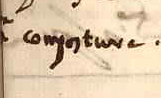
compostura.
